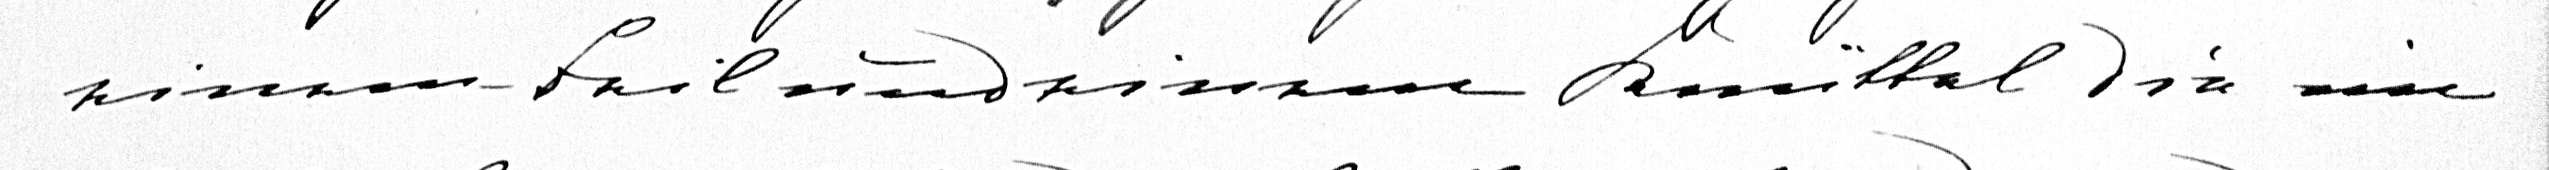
einem Beil und einem Knüttel die im
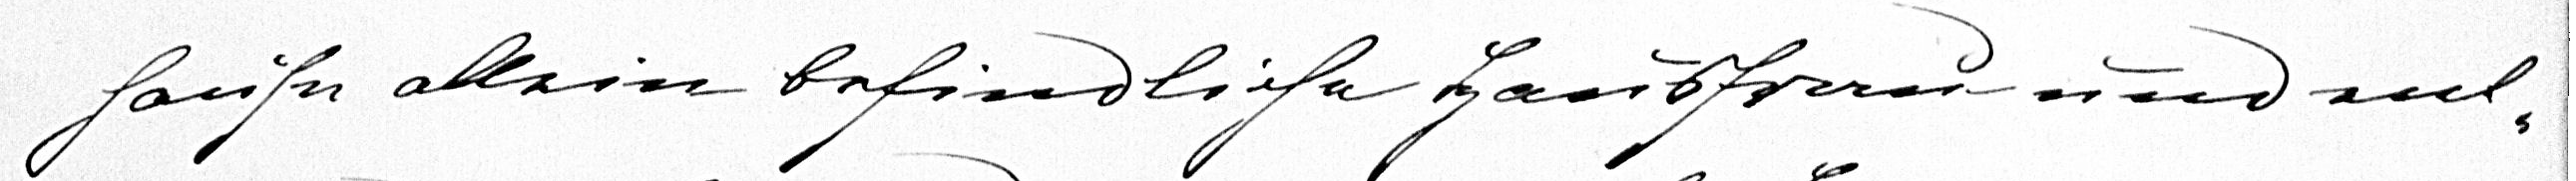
Hause allein befindliche Hausfrau und ent¬
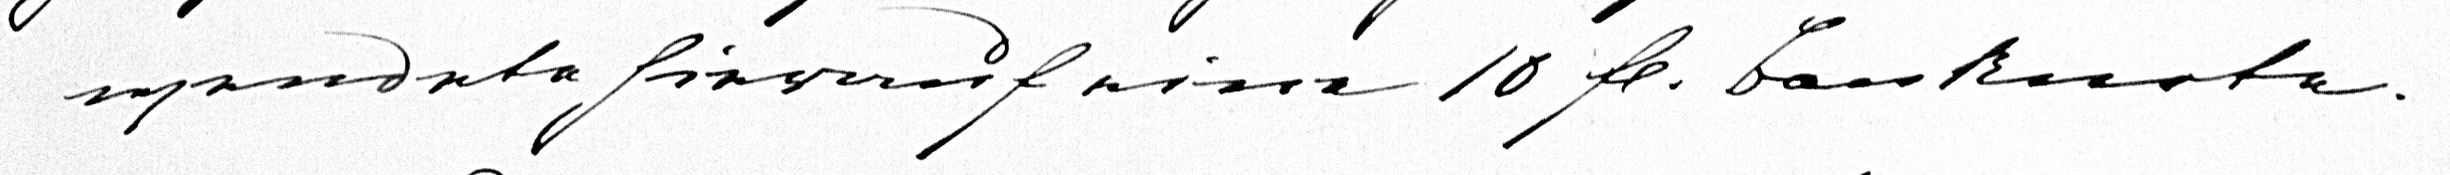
wendete hierauf eine 10. fl. Banknote.
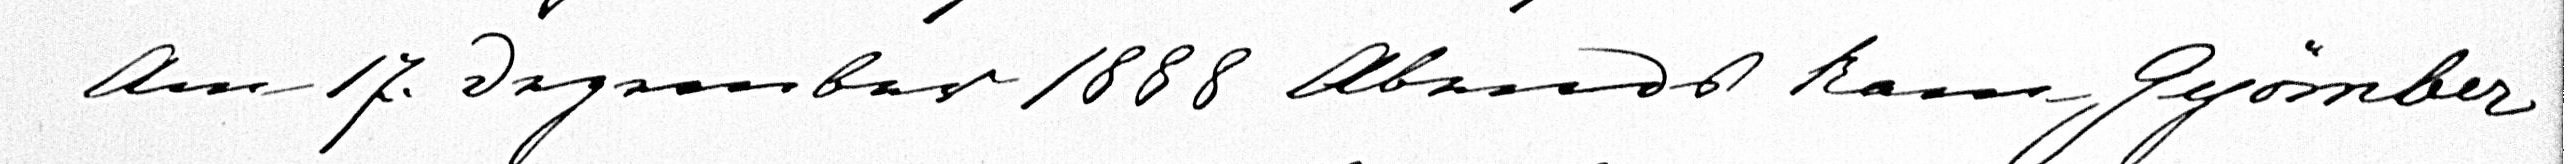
Am 17. Dezember 1888 Abends kam Gyömber
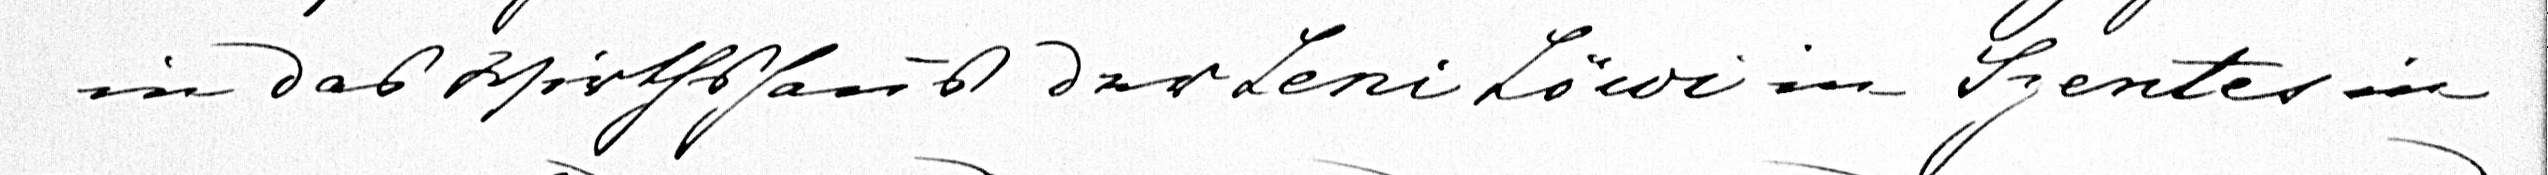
in das Wirthshaus der Leni Löwi in Szentes in
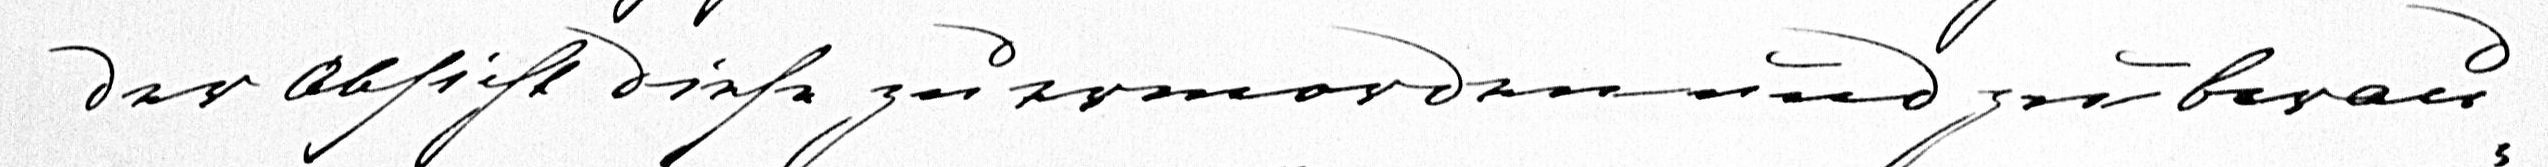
der Absicht diese zu ermorden und zu berau¬
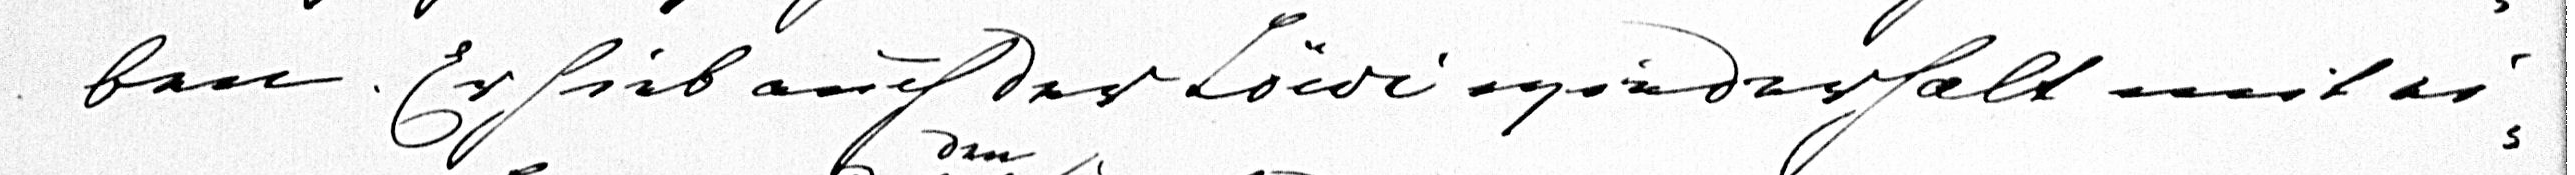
ben. Er hieb auch der Löwi wiederhalt mit ei¬
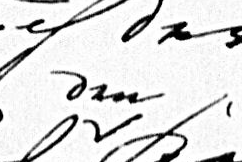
den
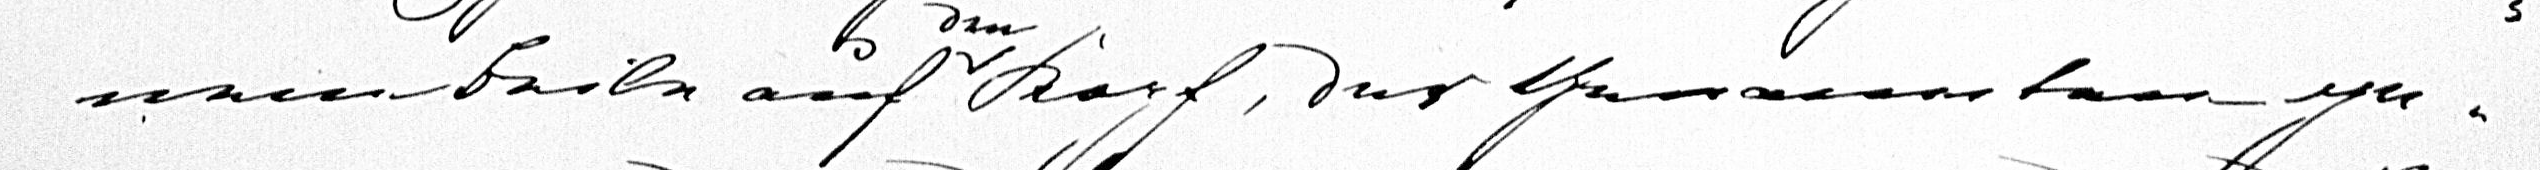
nen Beile auf Kopf, der Genormten ge¬
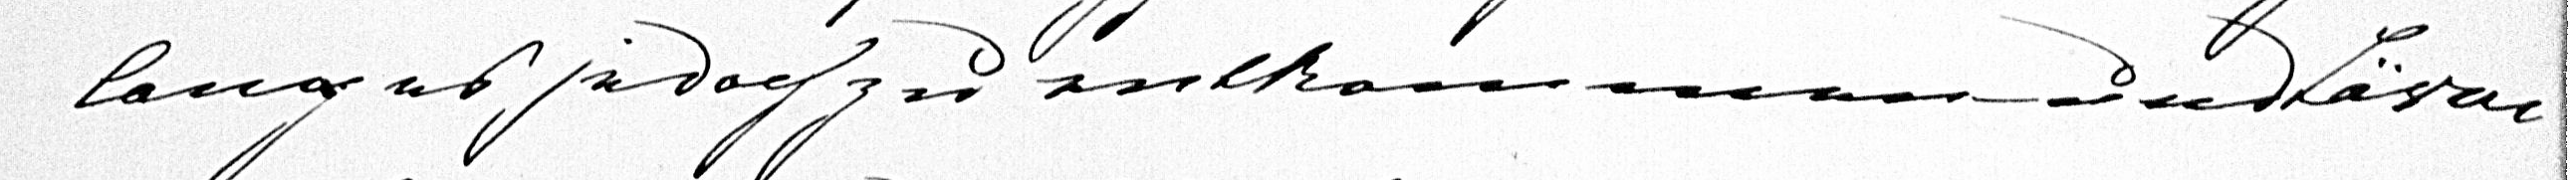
lang es jedoch zu entkommen und Lärac
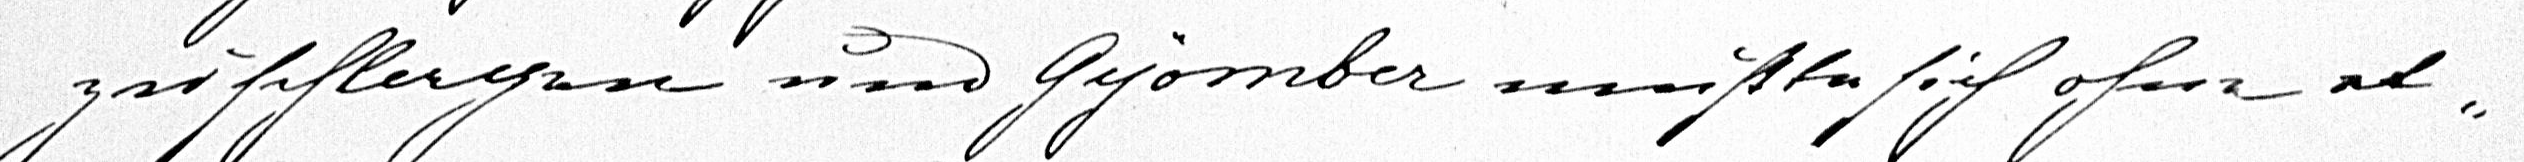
zuschlagen um Gyömber mußte sich ohne et¬
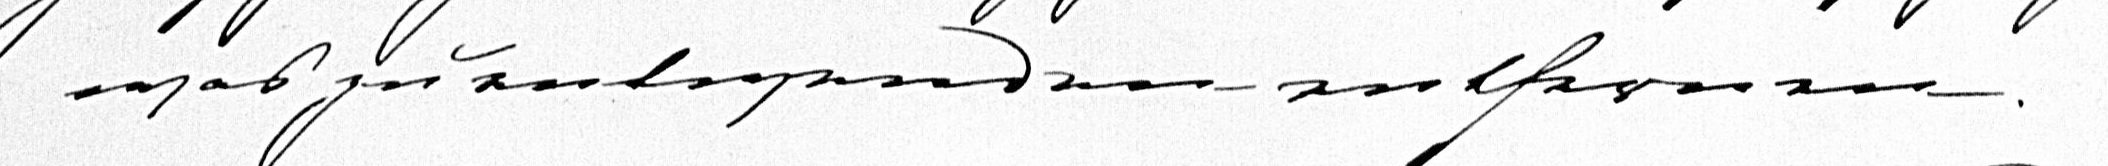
was zu entwenden entfernen.
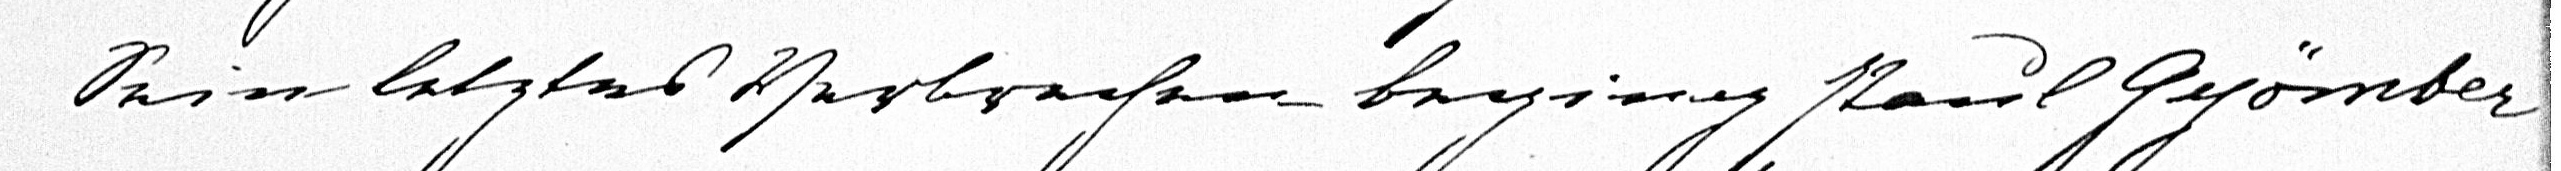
Sein letztes Verbrechen beging Paul Gyömber
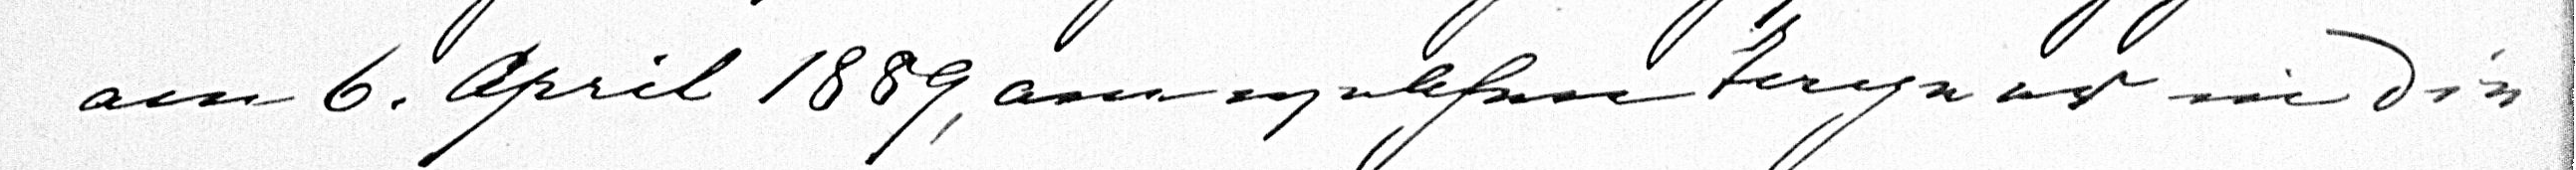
am 6. April 1889, am welchen Tage er in die
